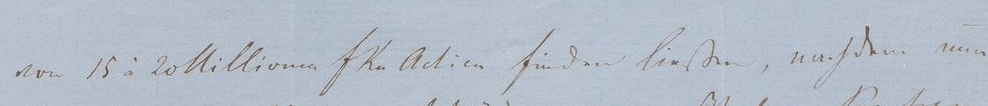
von 15 à 20 Millionen fkn Actien finden ließen, nachdem man
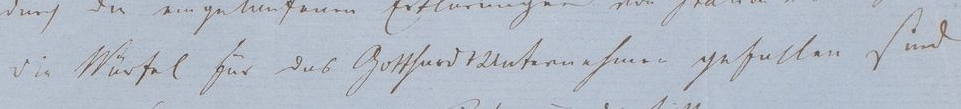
die Würfel für das GotthardtUnternehmen gefallen sind
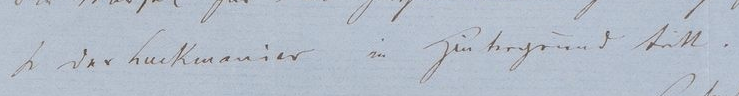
& der Luckmanier in Hintergrund tritt
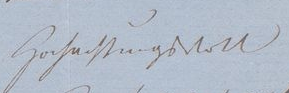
Hochachtungsvoll
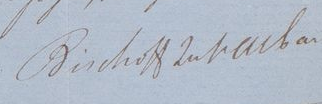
Bischoff zu St Alban
